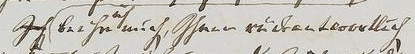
Ich beehre ich mich, Ihnen rückantwortlich
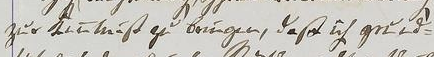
zur Kenntniß zu bringen, daß ich grund-
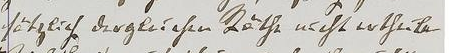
sätzlich dergleichen Räthe nicht ertheile †
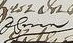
übrigens, der
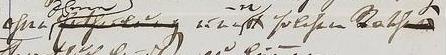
ohne ErtheilungIhnen einesn solchen Rathes
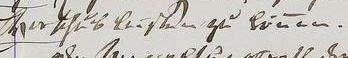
Vorschub leisten zu können.
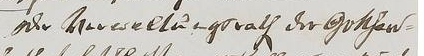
Der Verwaltungsrath der Gotthard-
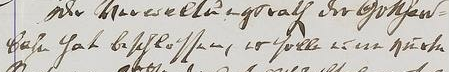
bahn hat beschlossen, es solle eine vierte
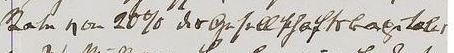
Rate von 20% des Gesellschaftskapitales
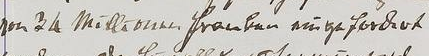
von 34 Millionen Franken eingefordert
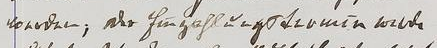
werden; der Einzahlungstermin werde
